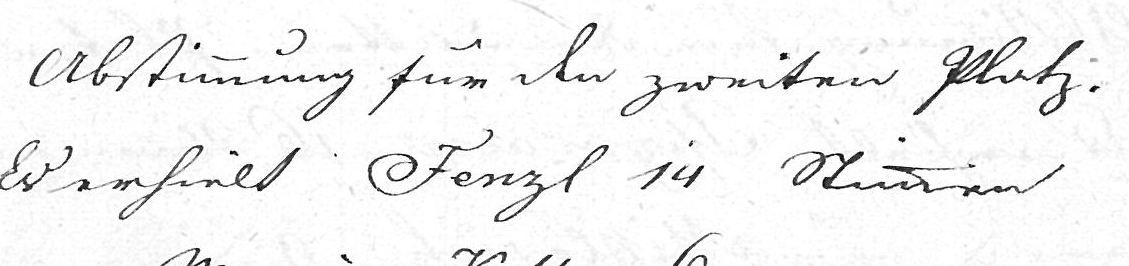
Abstimmung für den zweiten Platz.
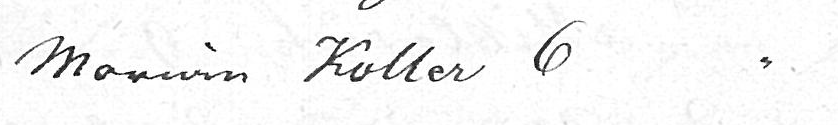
Marian Koller 6 "
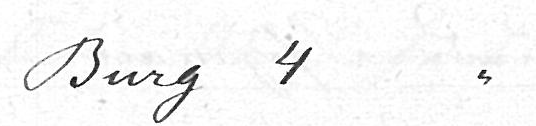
Burg 4 "
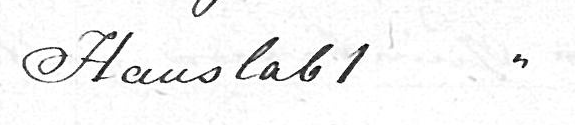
Hauslab 1 "
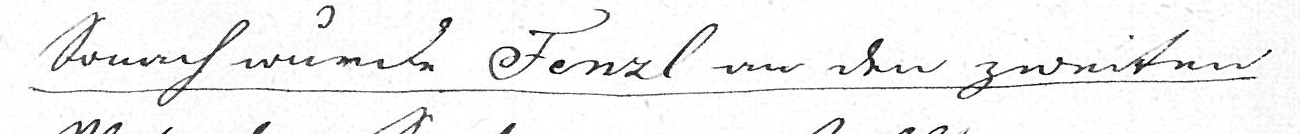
Sonach wurde Fenzl an den zweiten
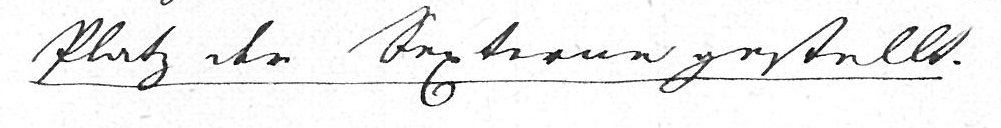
Platz der Sexterne gestellt.
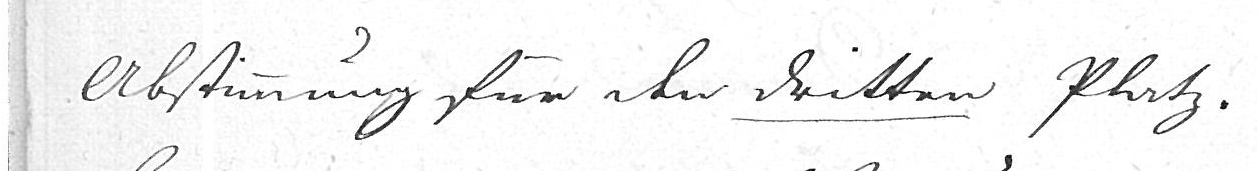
Abstimmung für den dritten Platz.
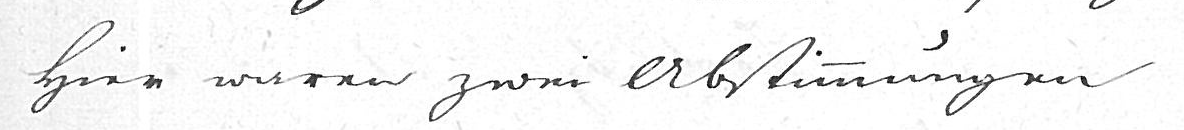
Hier waren zwei Abstimmungen
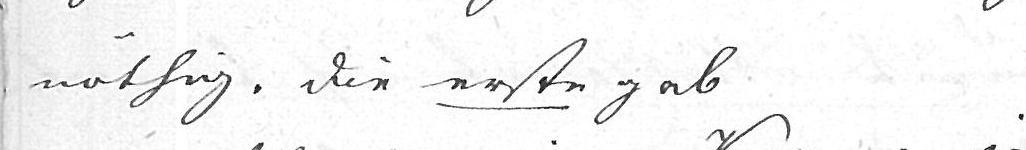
nöthig. Die erste gab
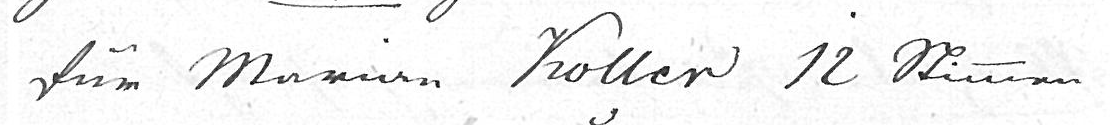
für Marian Koller 12 Stimmen
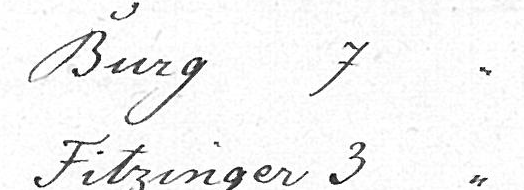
Burg 7 "
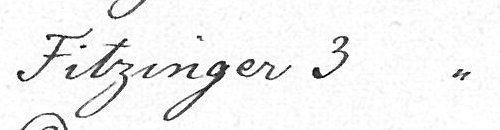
Fitzinger 3 "
